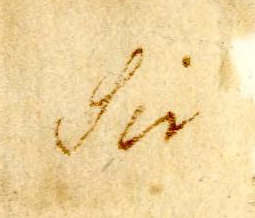Sir
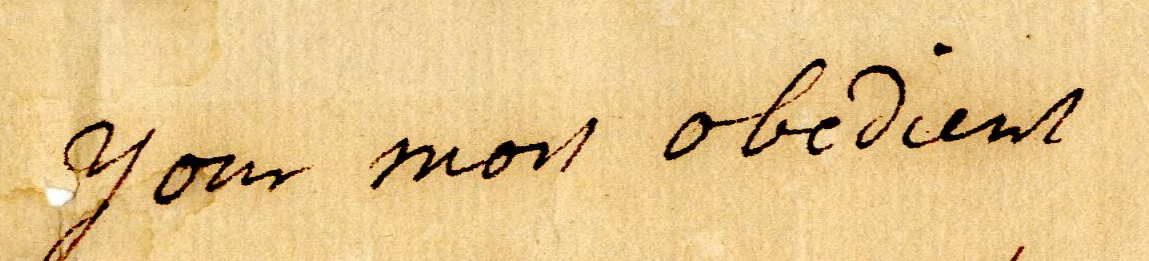Your most obedient
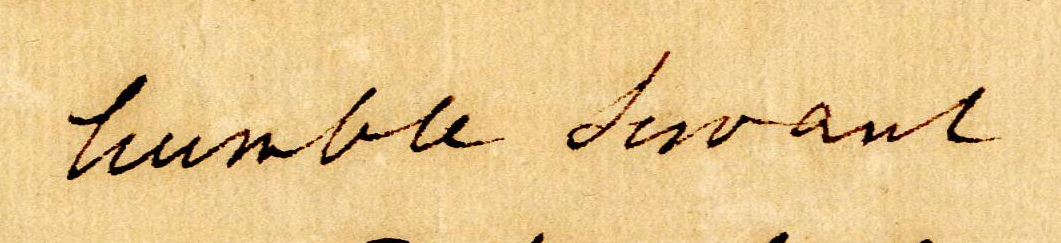humble Servant
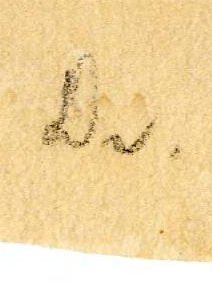Dr.
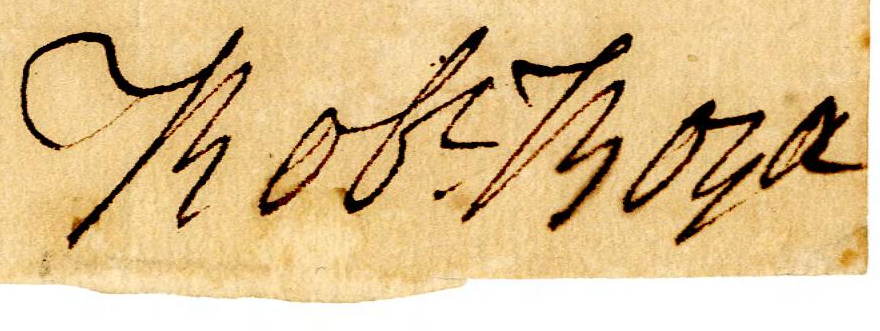Rob^t. Boyd
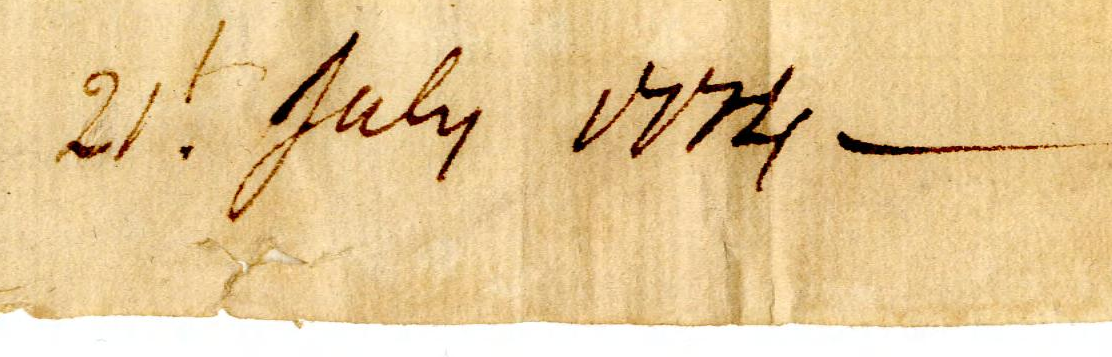21^t. July 1774-
